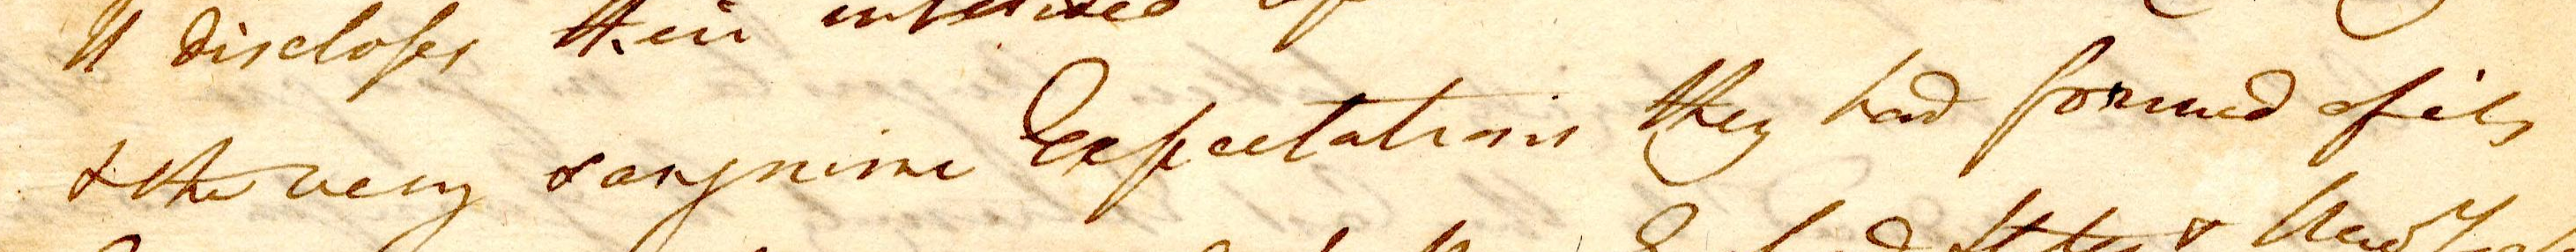& the very sangnine Expectations they had formed of its
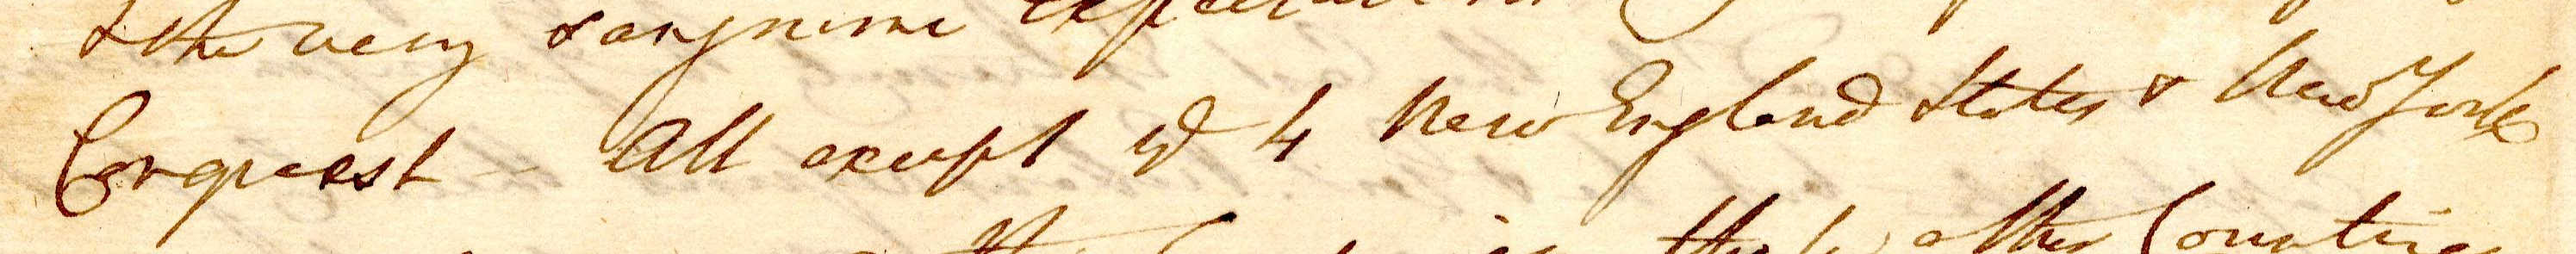Conquest. All except y^e 4 New England states & New York
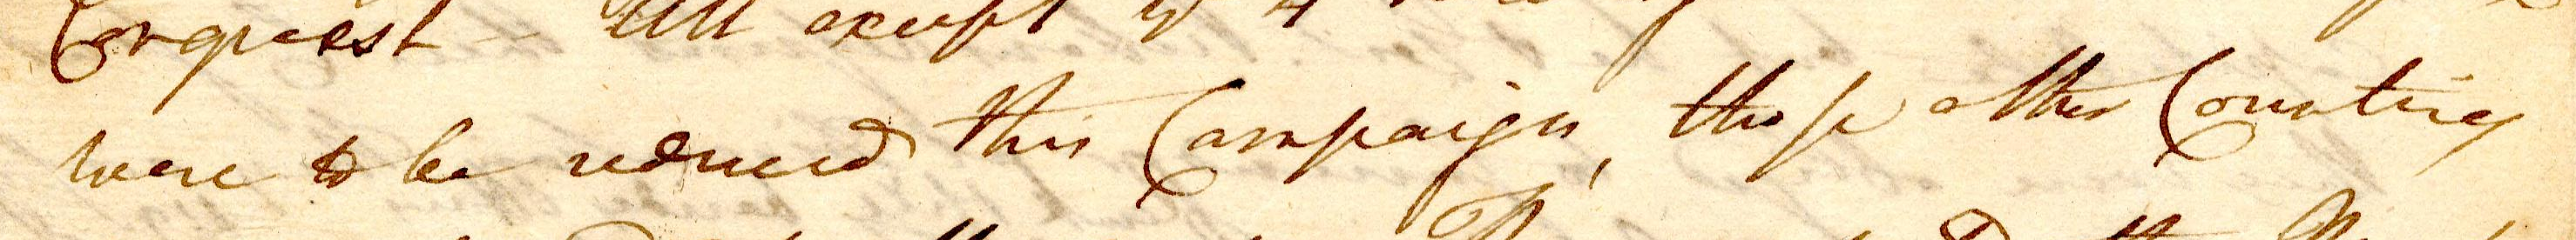were to be reduced this Campaign, those other Countries
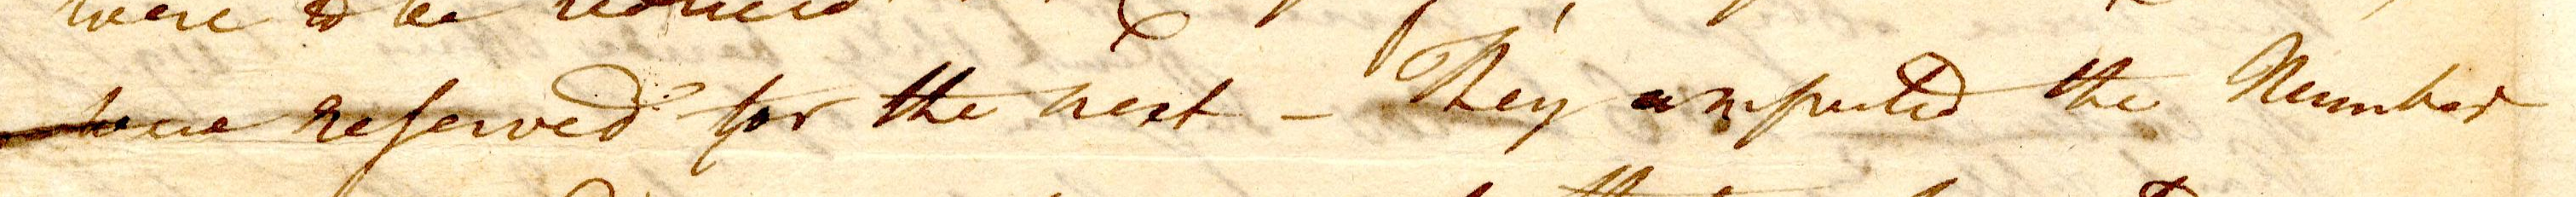were reserved tor the next. They expected the Number
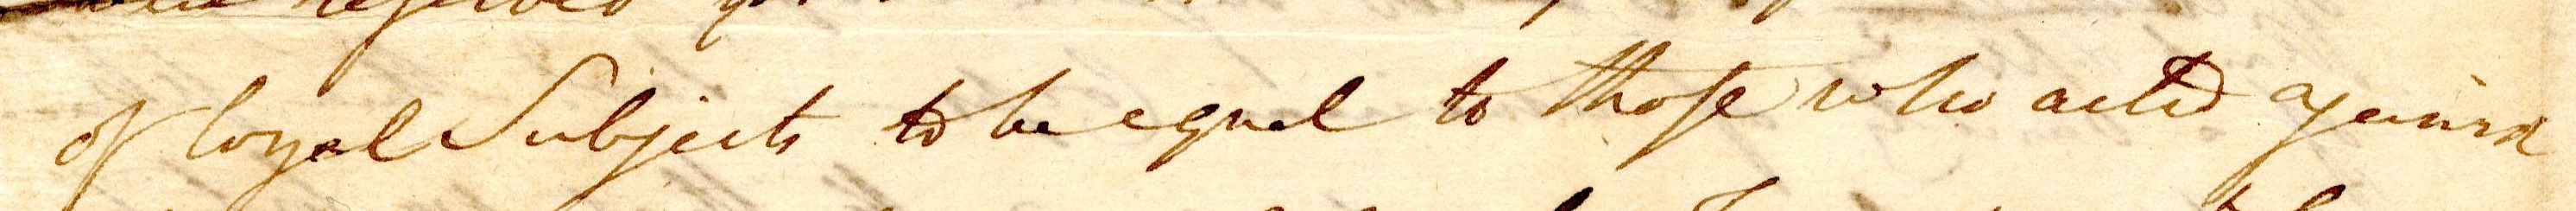of loyal Subjects to be equal to those who acted against
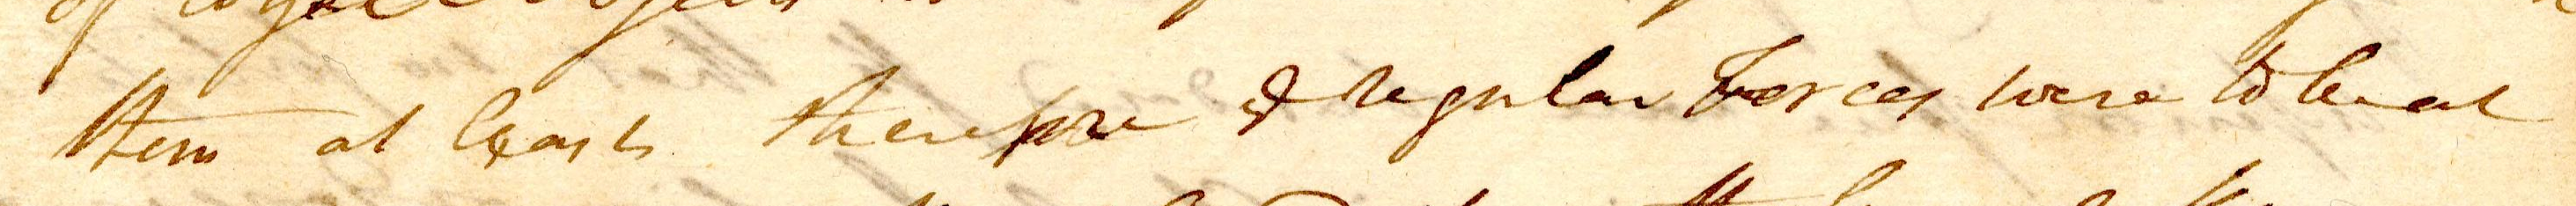them at least therefore y^e regular Forces were to beat
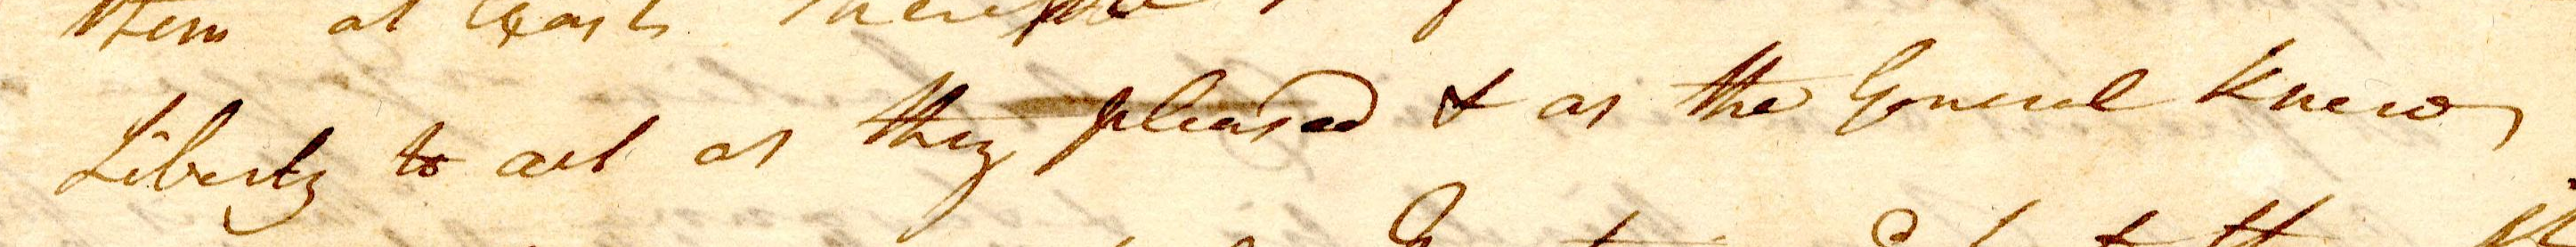Liberty to act as they pleased & as the General knew
